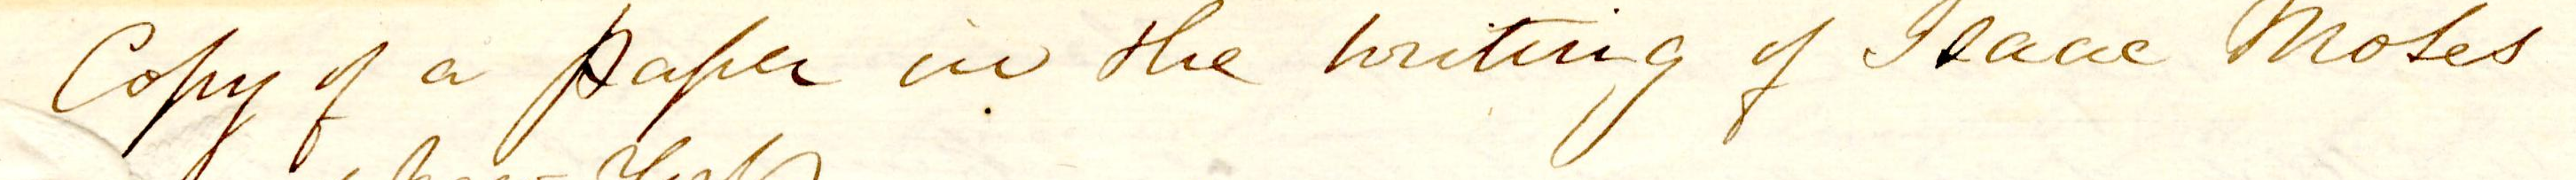Copy of a paper in the writing of Isaac Moses
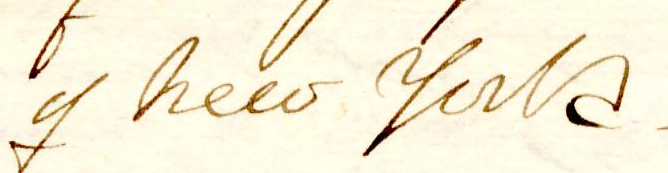of New York
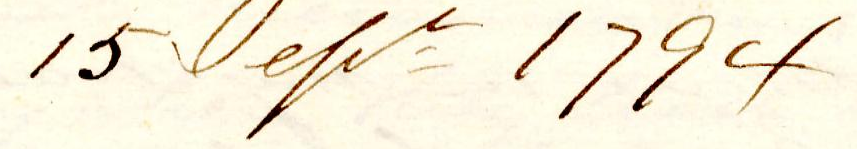15 Sep^r. 1794
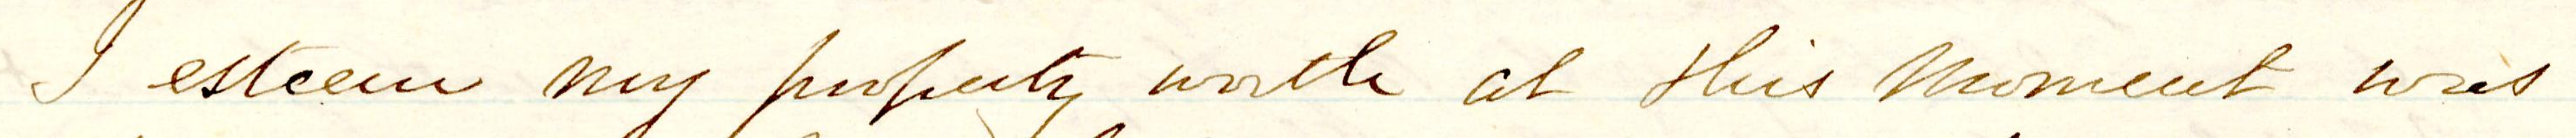I esteem my property worth at this moment was
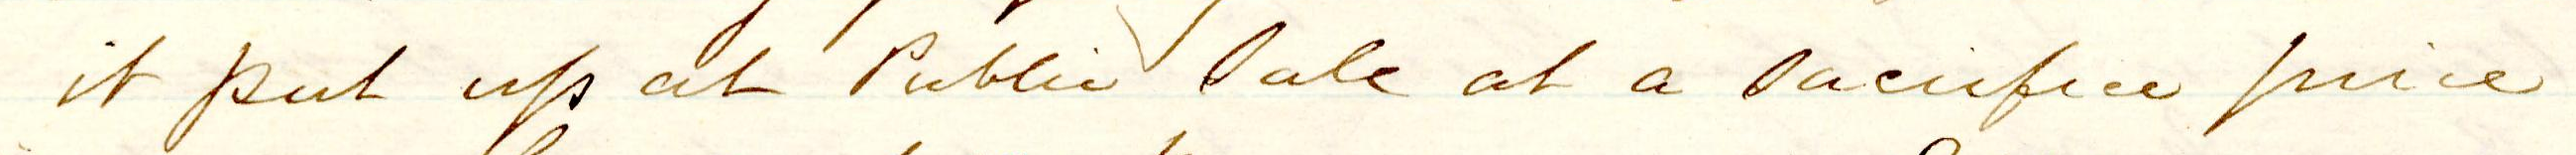it put up at Public sale at a sacrifice price
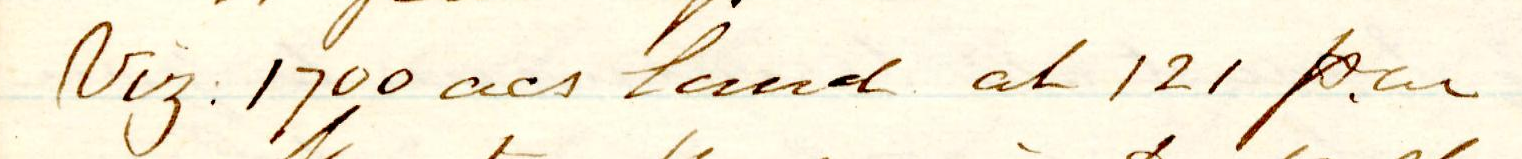Viz: 1700 acs land at 121 per ac
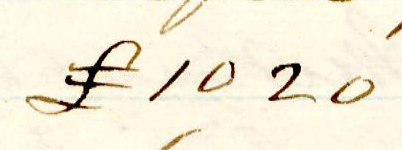£1020
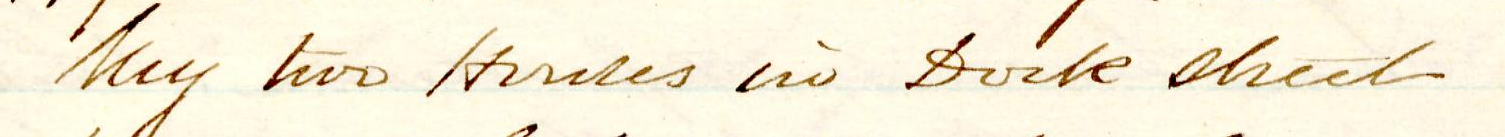My two Houses in Dock street
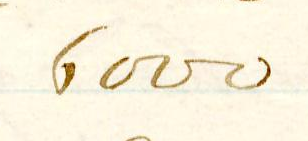6000
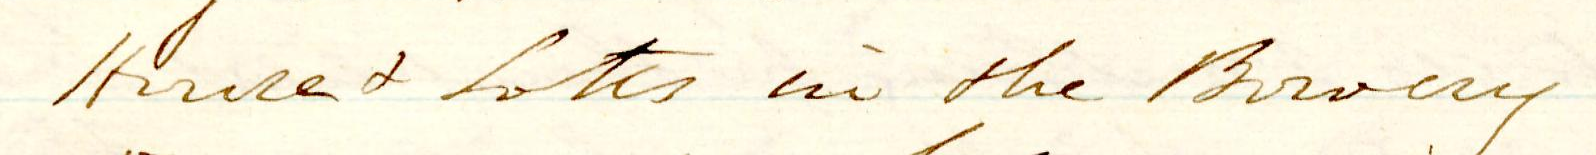House & lots in the Brewery
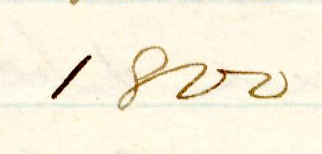1800
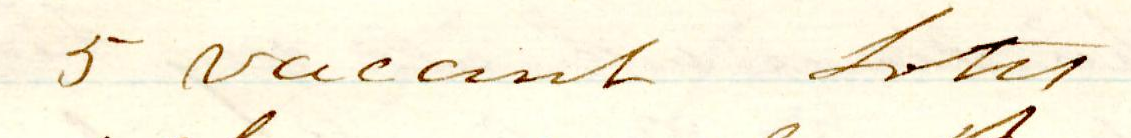5 vacant Lotts
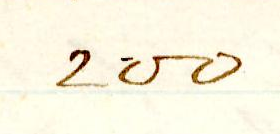200
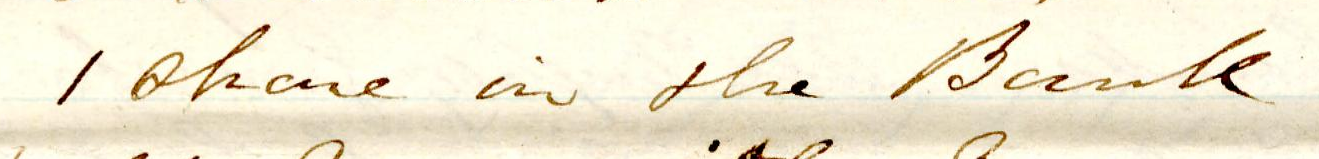1 share in the Bank
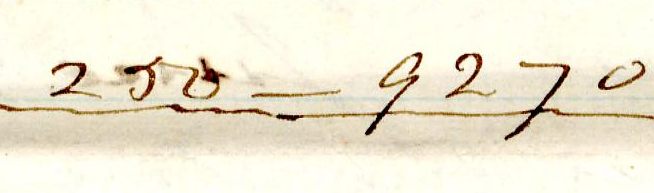250 - 9270
